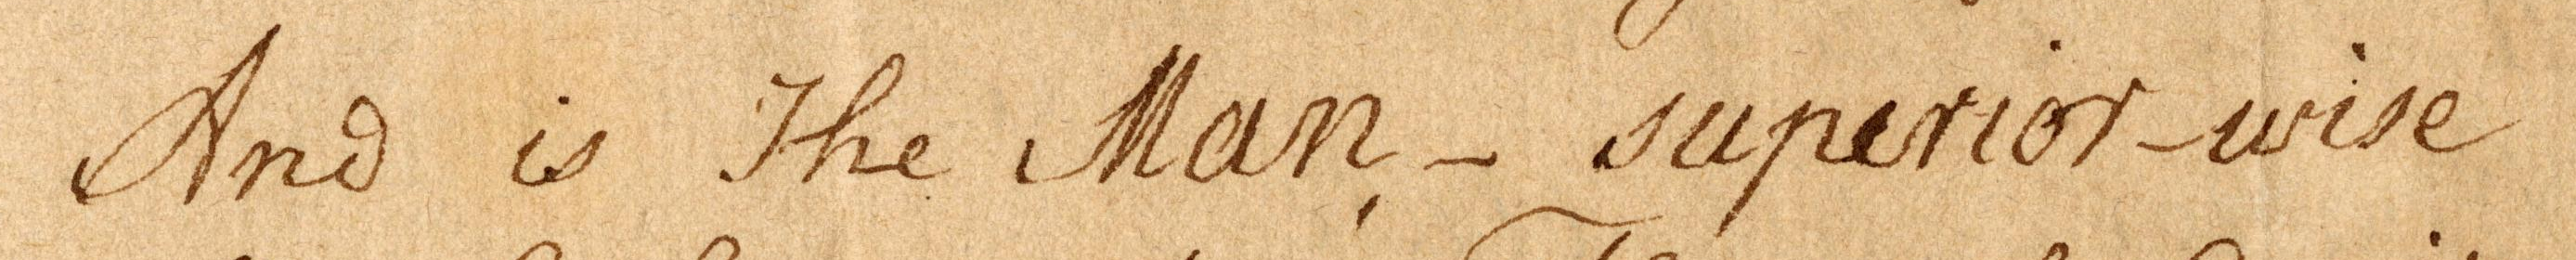And is the Man- superior-wise
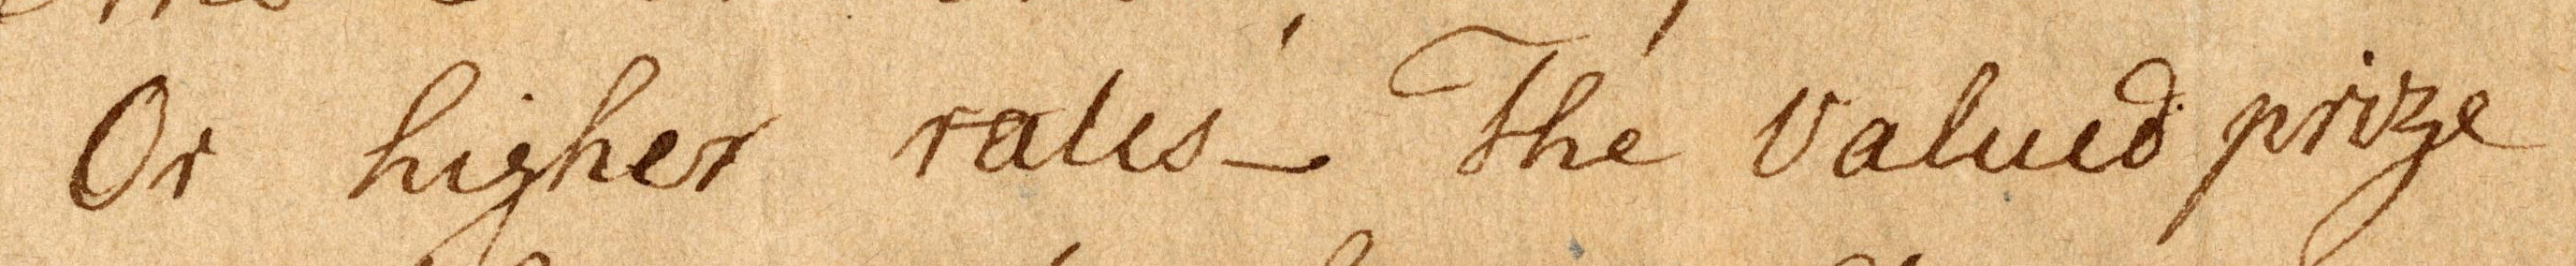Or higher rates- The valued prize
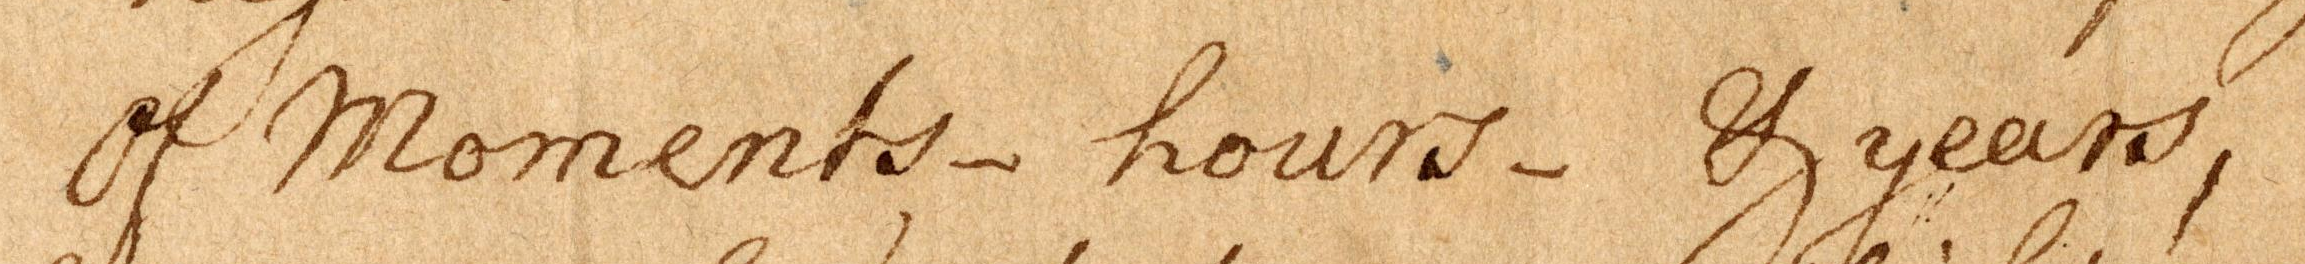Of Moments- hours- & years,
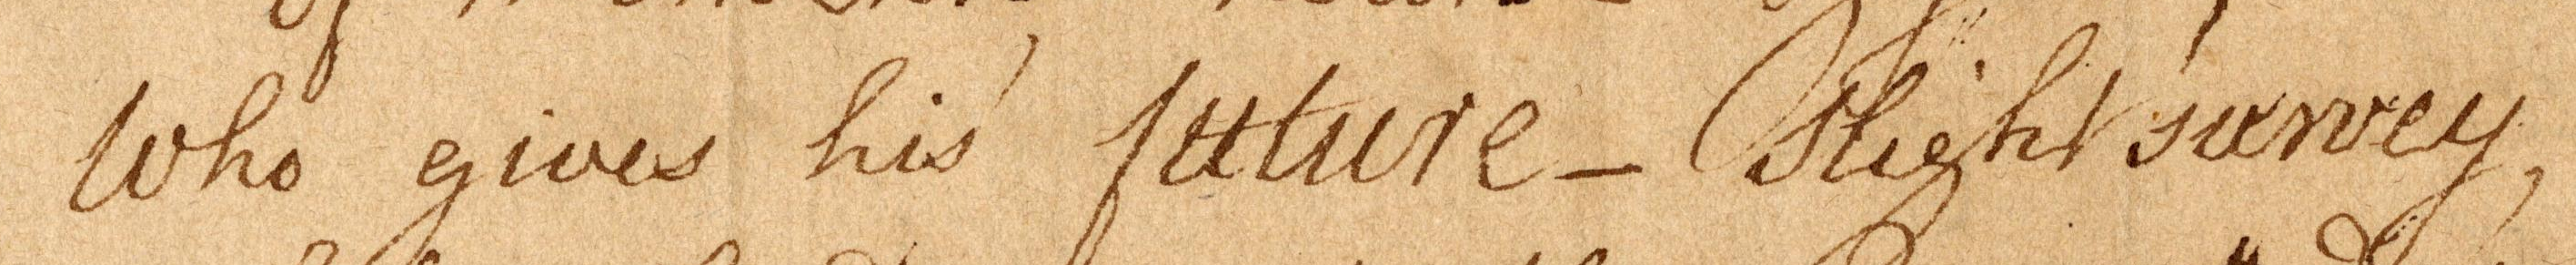Who gives his future- slight survey,
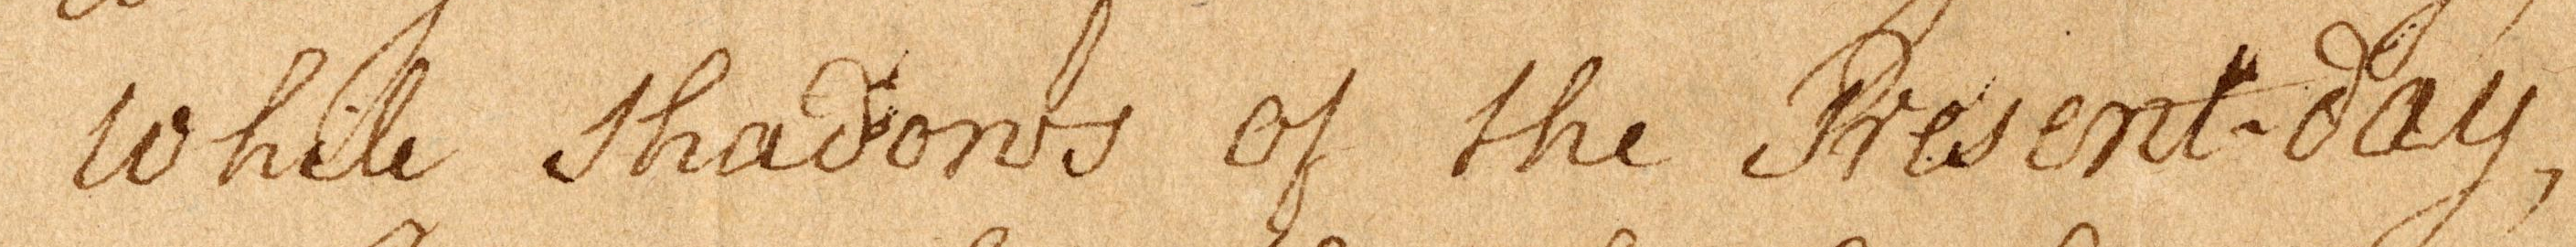While Shadows of the Present-day,
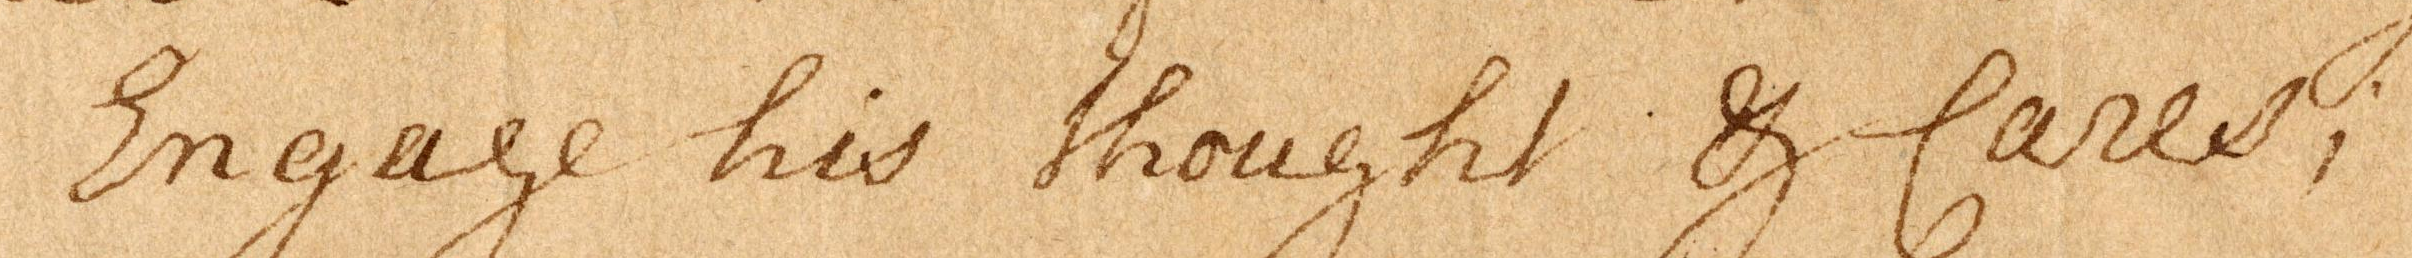Engage his thought & Cares;
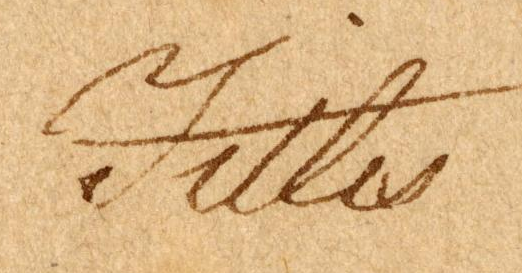Titles
